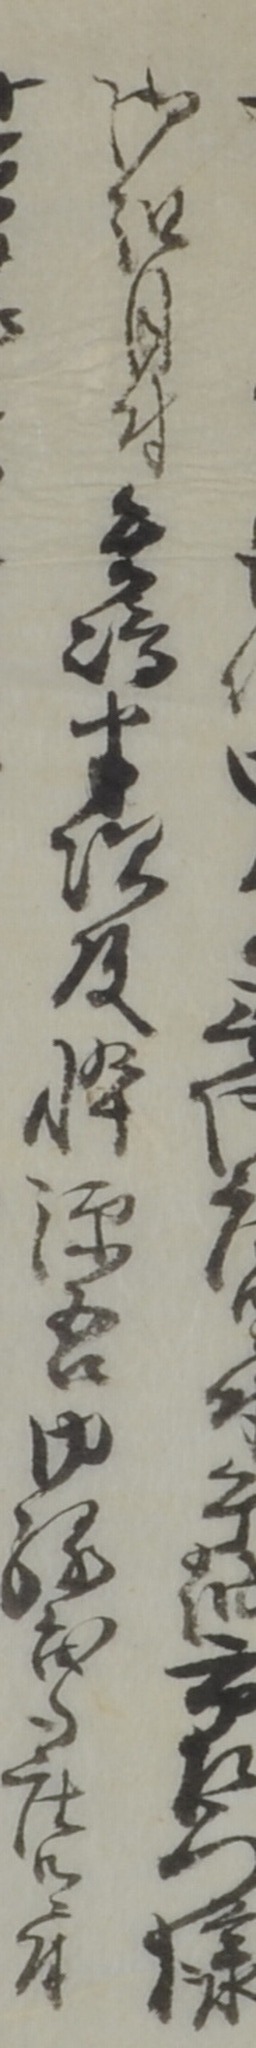御組目付矢嶋半次殿忰源吾内縁も御座候ニ付
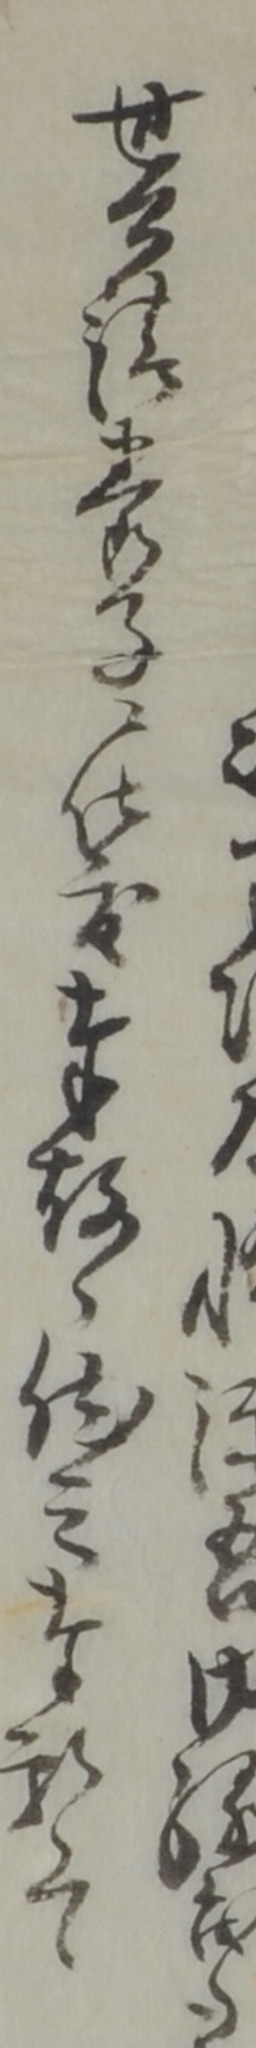貰請養子ニ仕度奉存候依之奉願上候
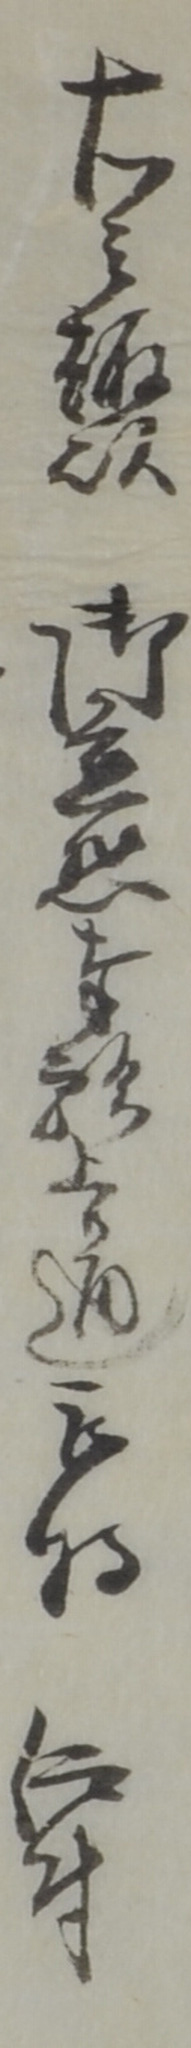右之趣以御慈悲奉願上候通被為仰付
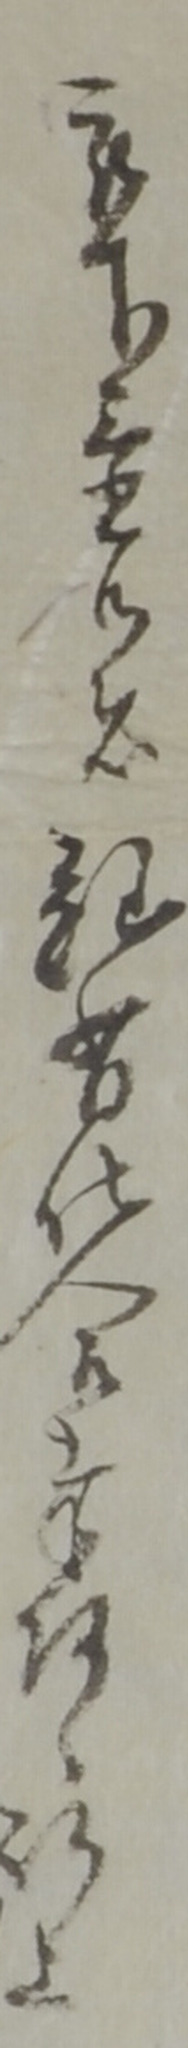被下置候者難有仕合奉存候以上
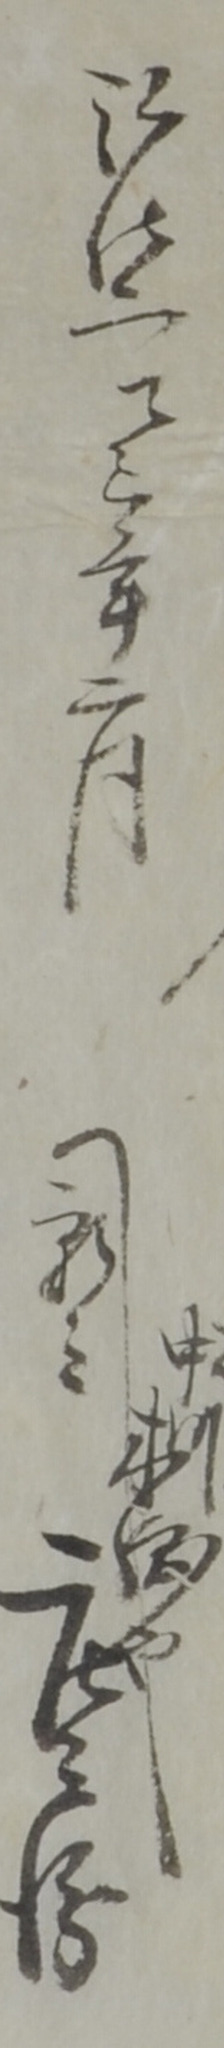弘化一乙巳年二月願主庄兵衛
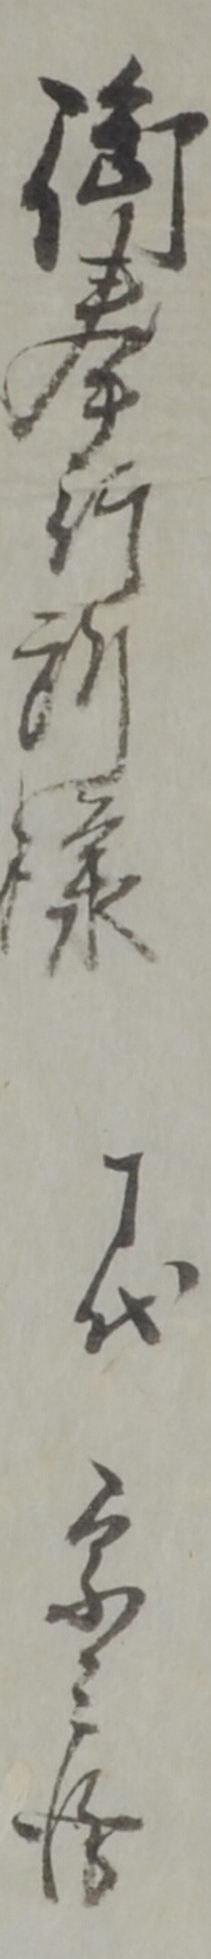御奉行所様丁代宗兵衛
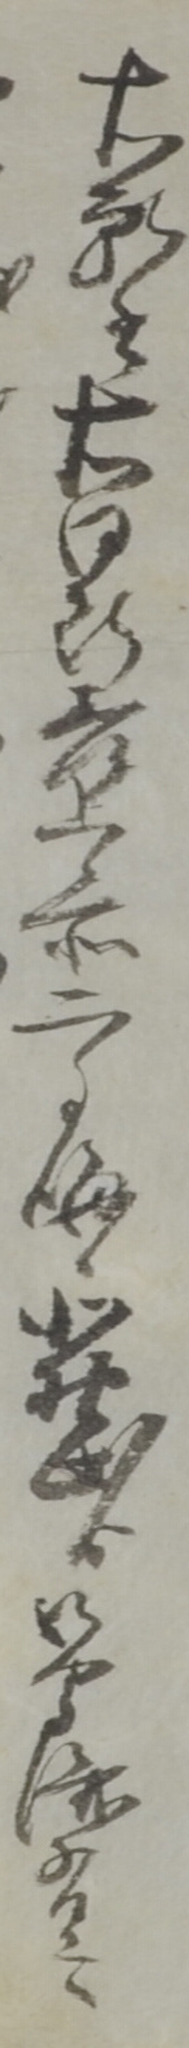右願書右同断差上候所二月晦日北野氏ゟ御聞済有之
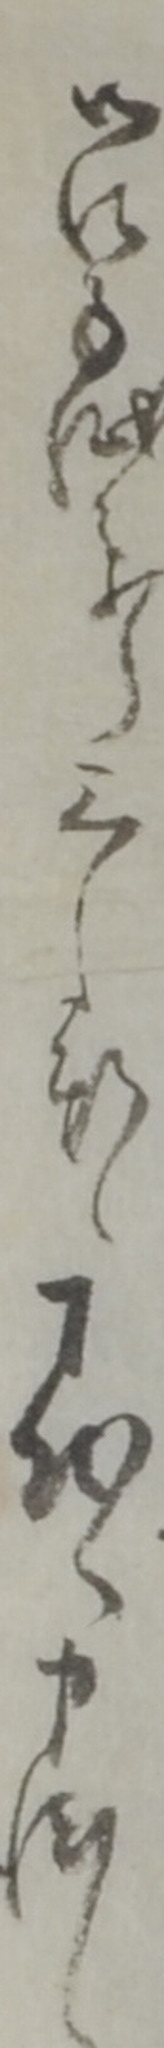候御手紙参り三月朔日丁代へ申渡候

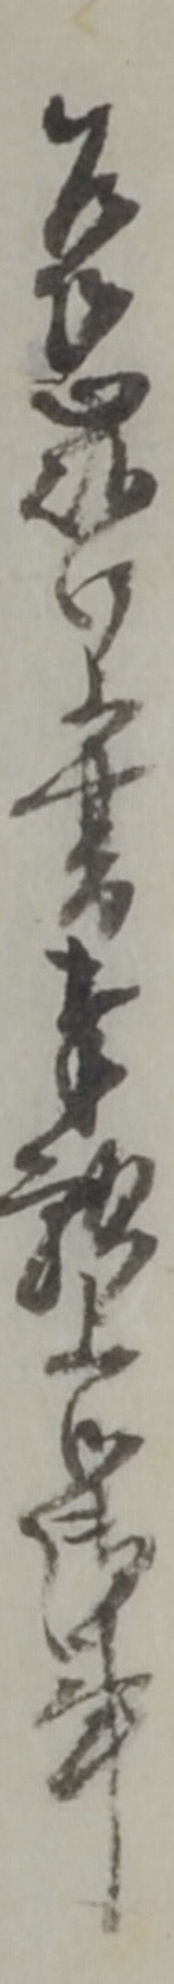乍恐以口上書奉願上候御事
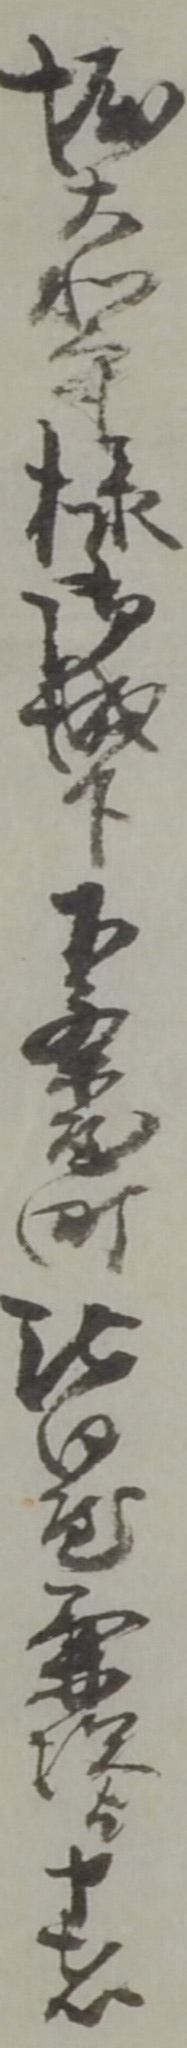堀大和守様御城下下条屋町池田屋兼次与申者
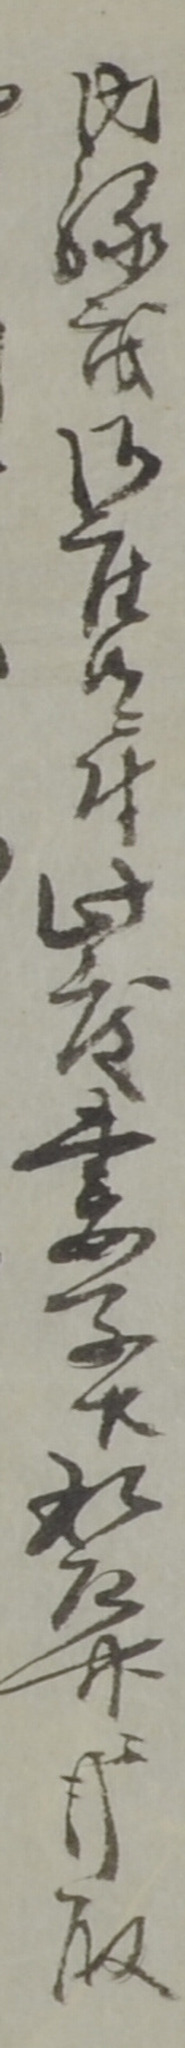内縁も御座候ニ付此度妻子共私厄介ニ引取
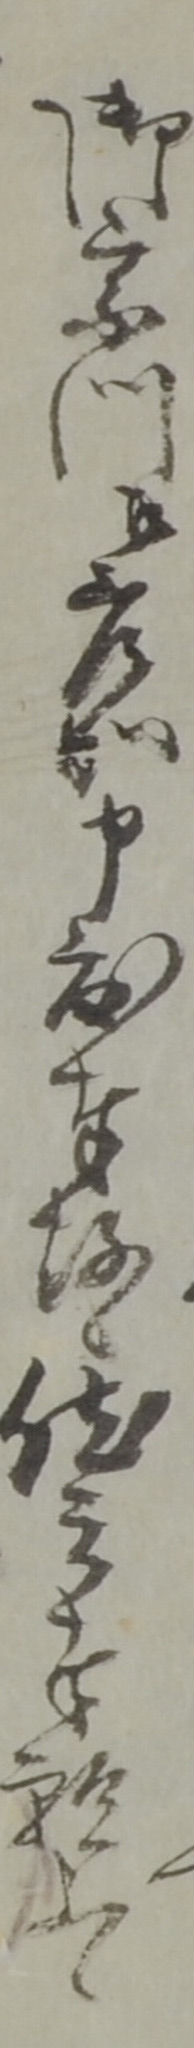御宗門江差加申度奉存候依之奉願上候
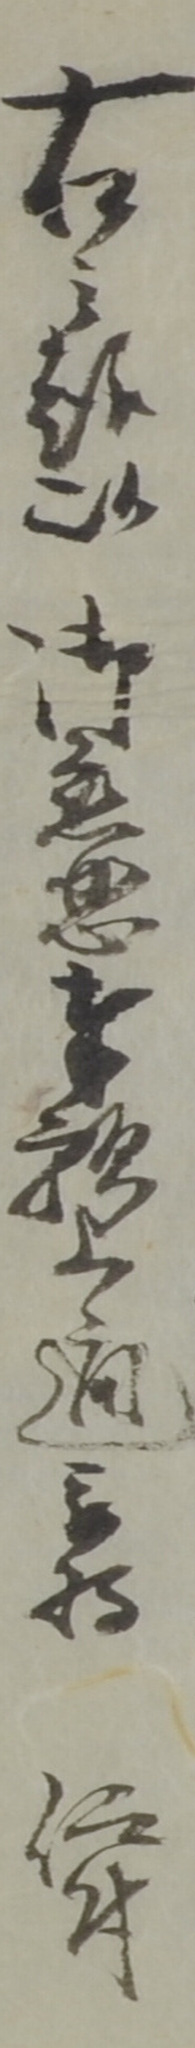右之趣以御慈悲奉願上候通被為仰付
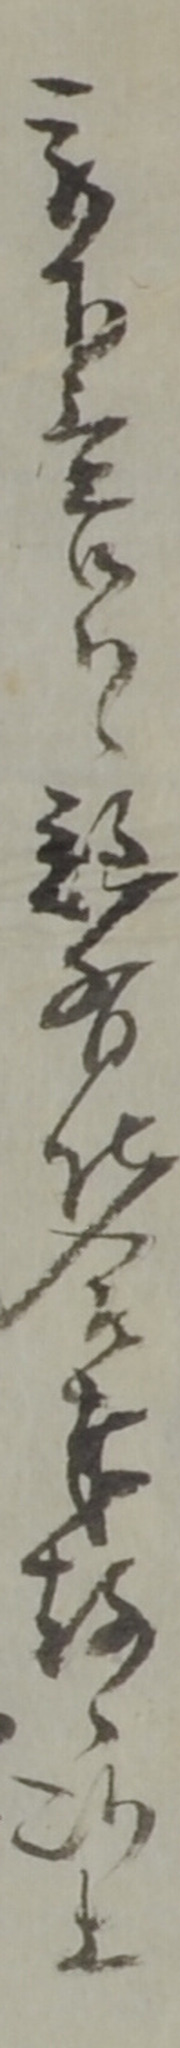被下置候ハヽ難有仕合奉存候以上
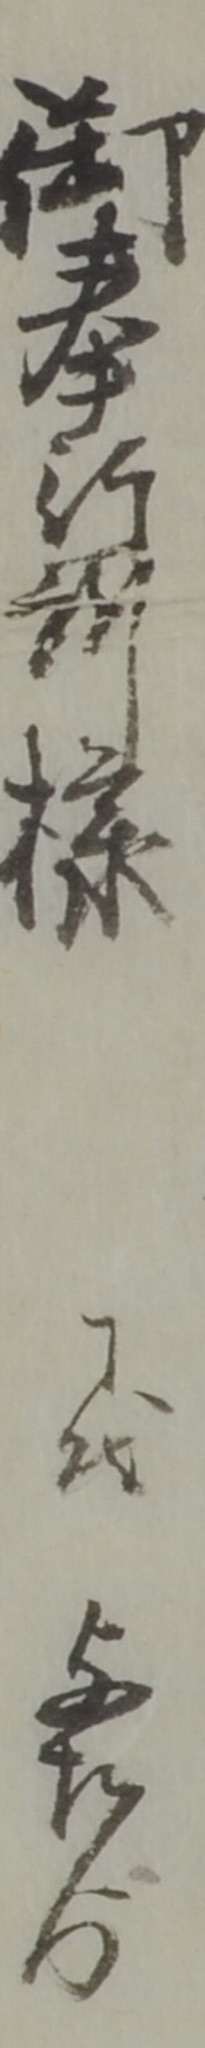御奉行所様丁代与左衛門
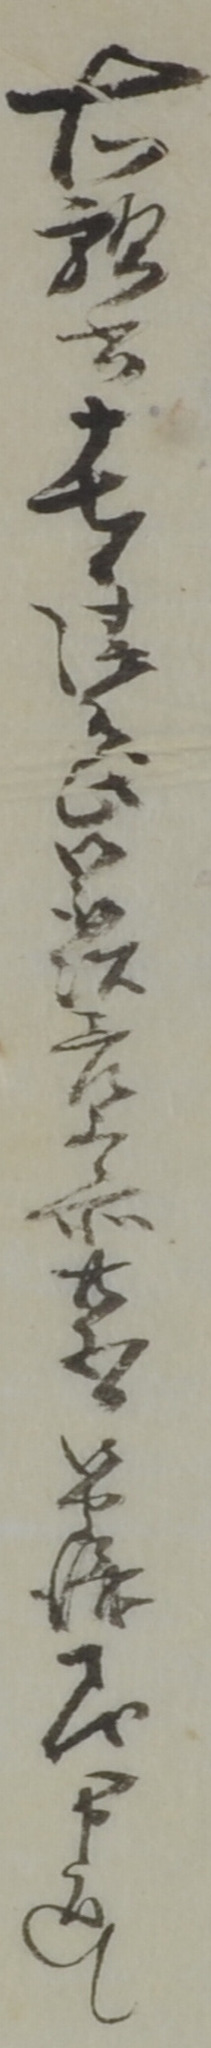右願書十七日清水氏御取次差上候所廿五日御聞済丁代へ申通候
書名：諸願書控簿
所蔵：伊那市立高遠町図書館・合同会社AMANE
